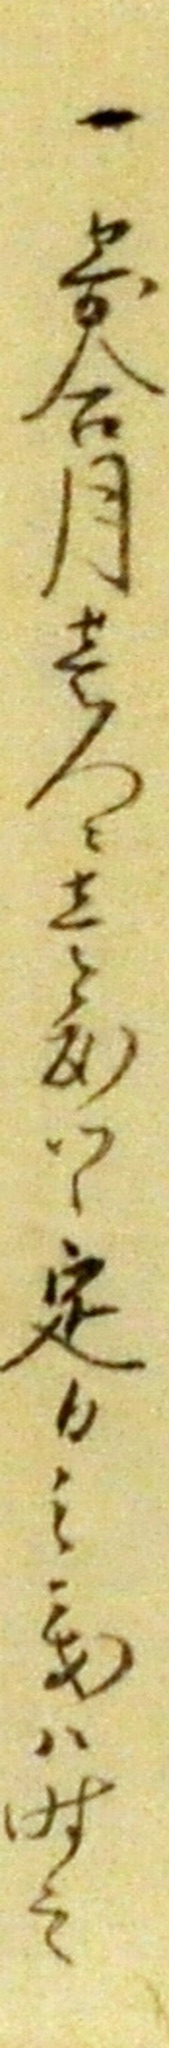一寄合月壱人に壱度ツヽ定日之義は時之
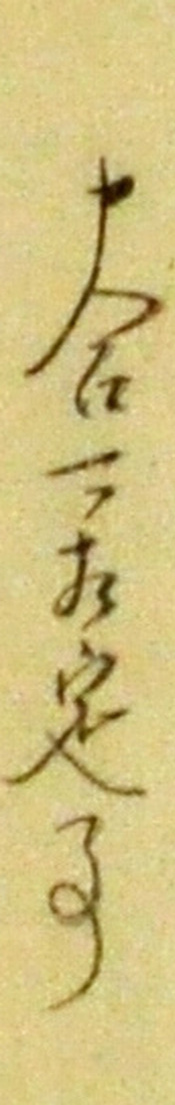申合可相定事
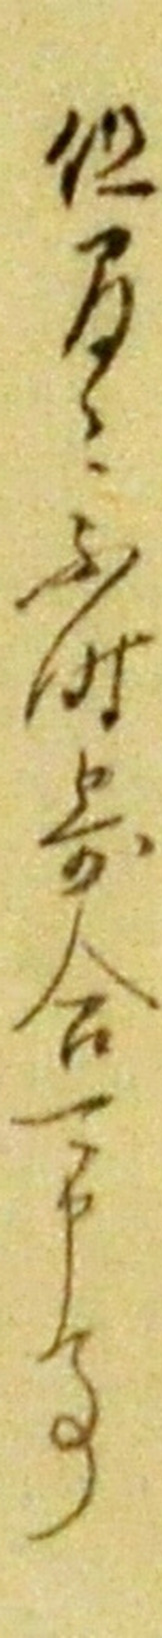但間に不時寄合可申事
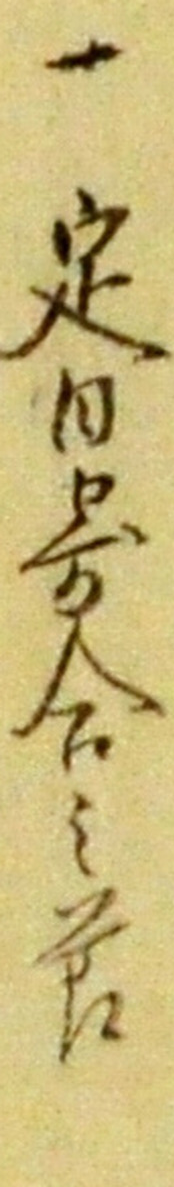一定日寄合之節
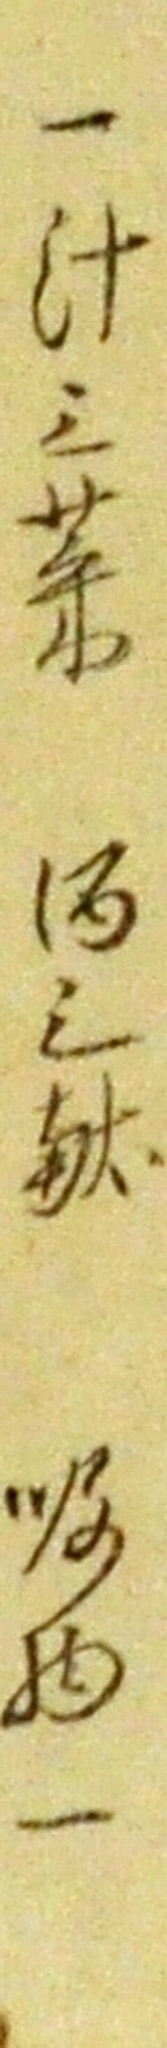一汁三菜酒三献吸物一
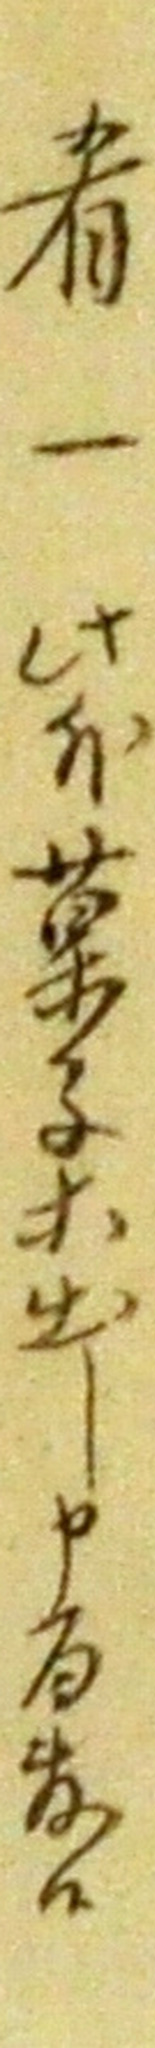肴一此外菓子等出し申間敷候
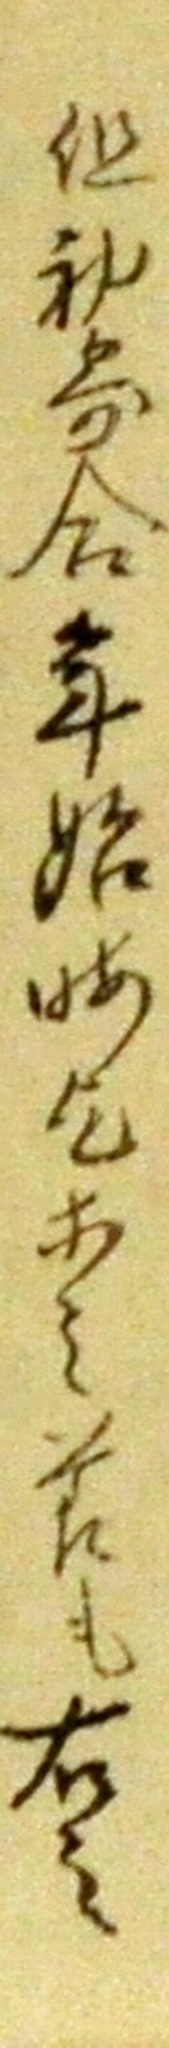但初寄合年始暇乞等之節も右之
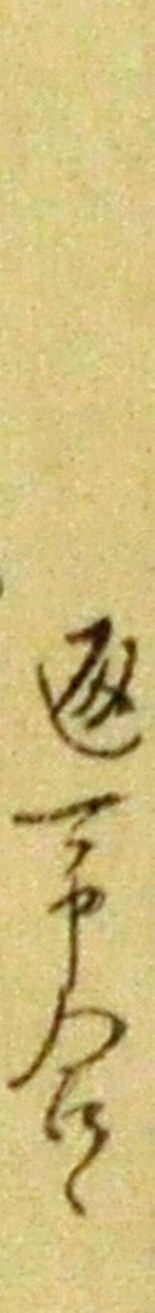通可申合候
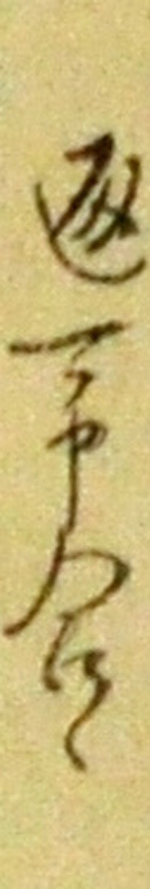通可申合候
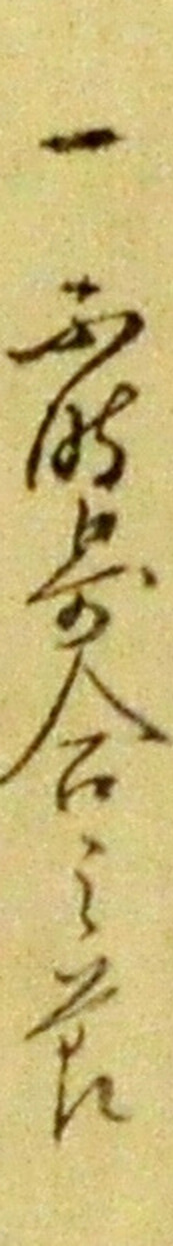一不時寄合之節
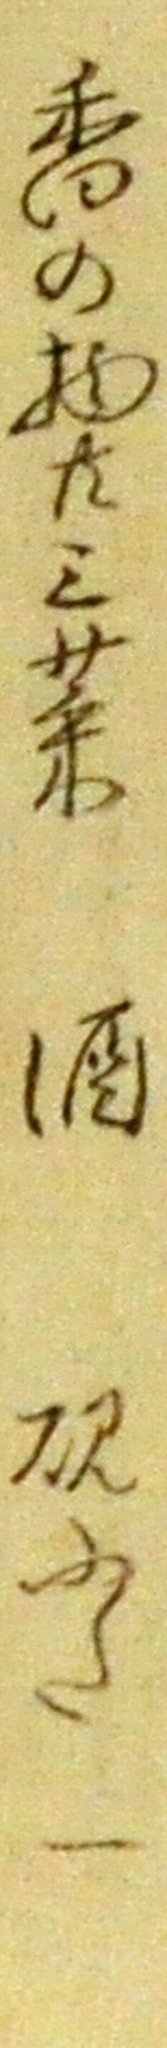香の物共三菜酒硯ふた一
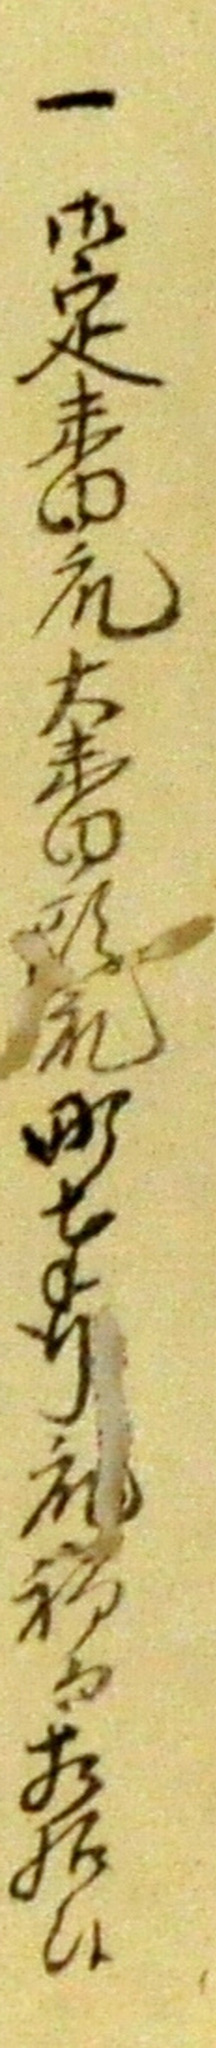一御定番衆大番頭衆町奉行衆初而相招候
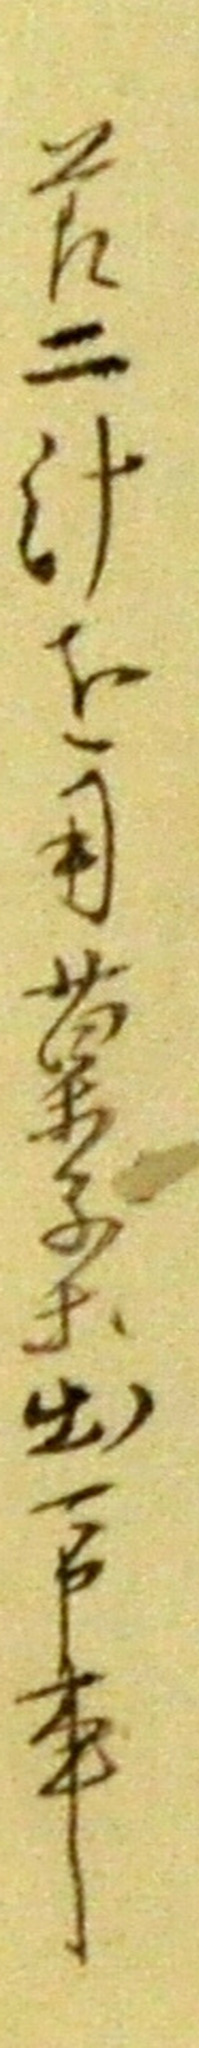節二汁を用菓子等出可申事
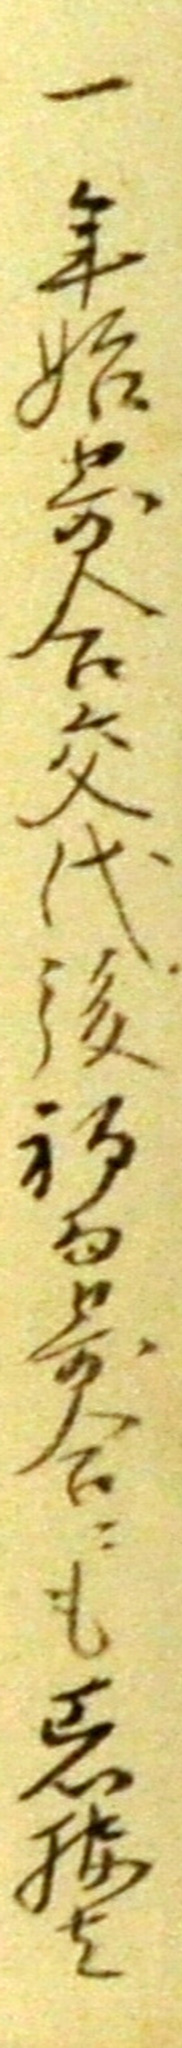一年始寄合交代後初而寄合にも着服は

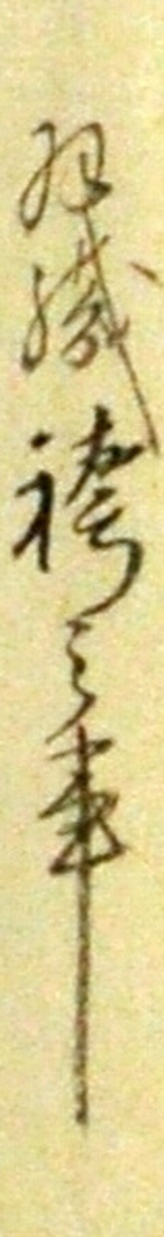羽織袴之事
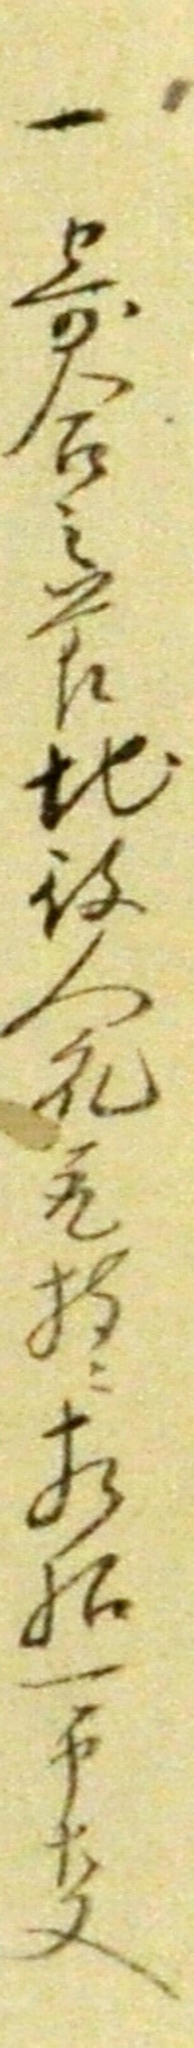一寄合之節地役人衆取持に相招可申事
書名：大阪加番関係諸書留〔一括〕
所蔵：伊那市立高遠町図書館・合同会社AMANE
